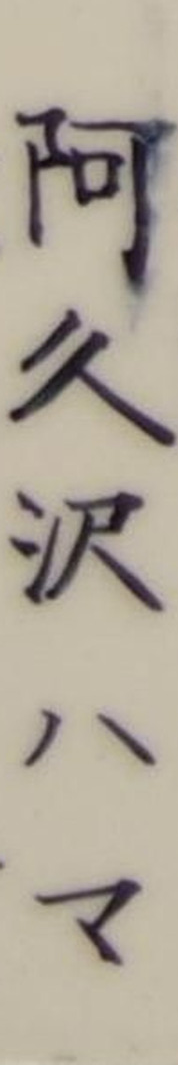阿久沢ハマ
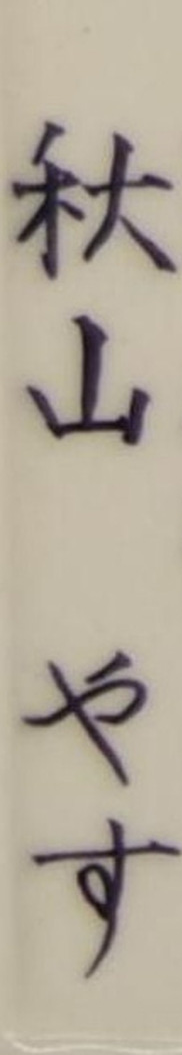秋山やす

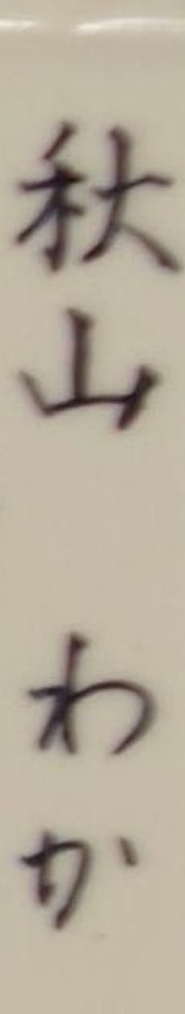秋山わか
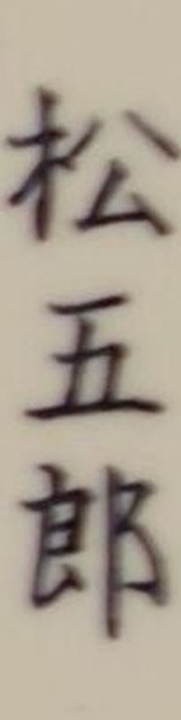松五郎
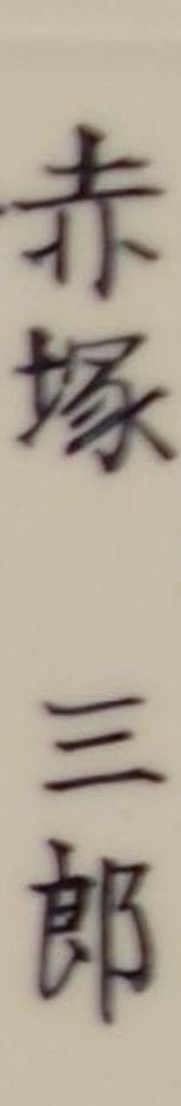赤塚三郎
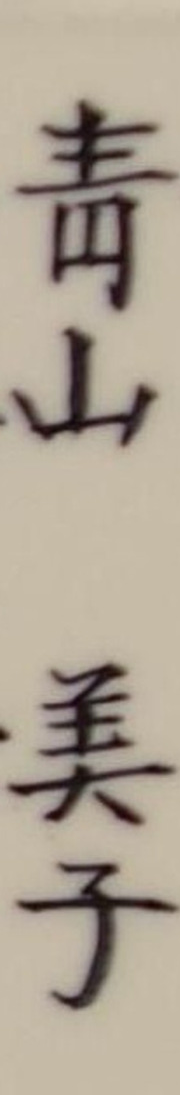青山美子
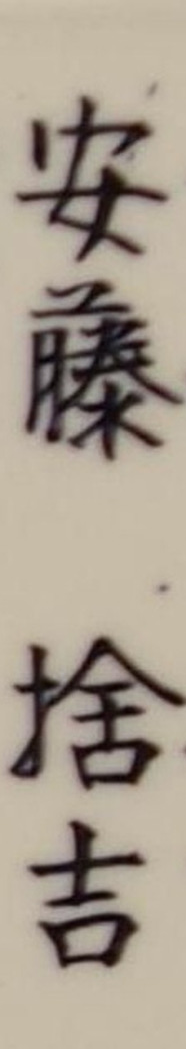安藤捨吉
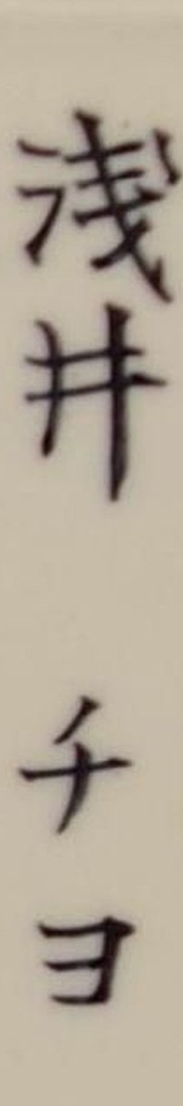浅井チヨ
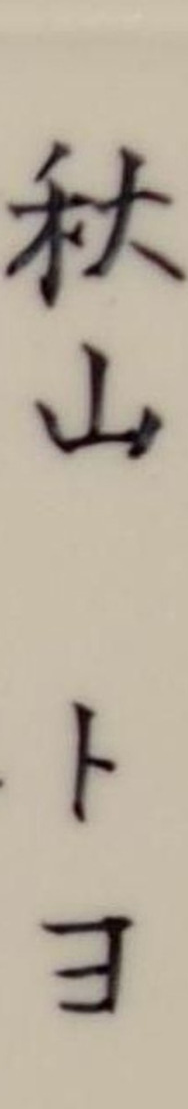秋山トヨ
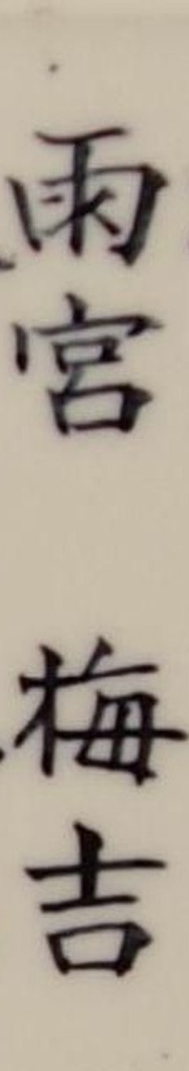雨宮梅吉
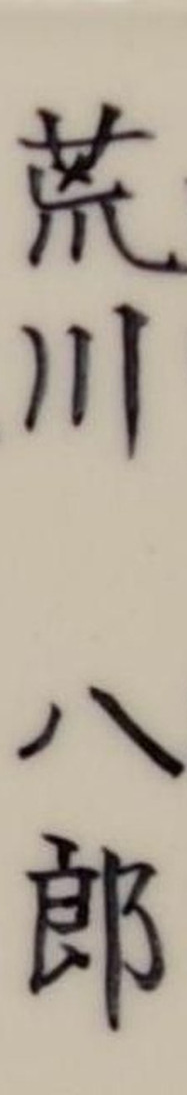荒川八郎
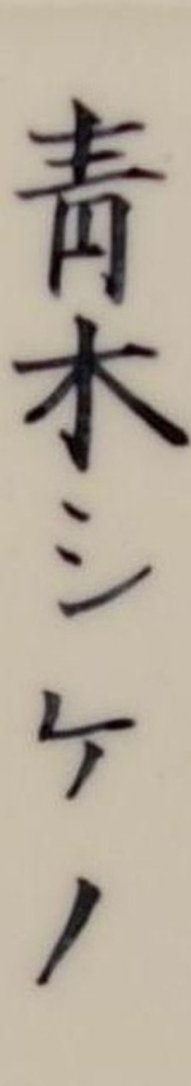青木シケノ
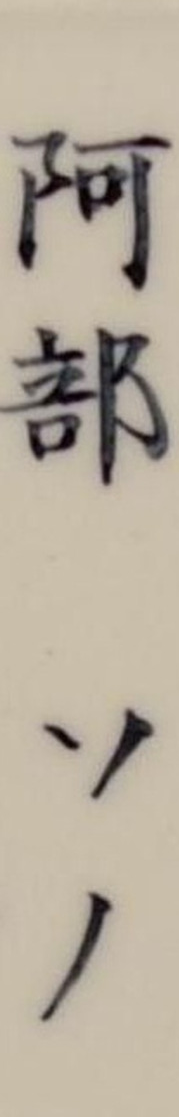阿部ソノ
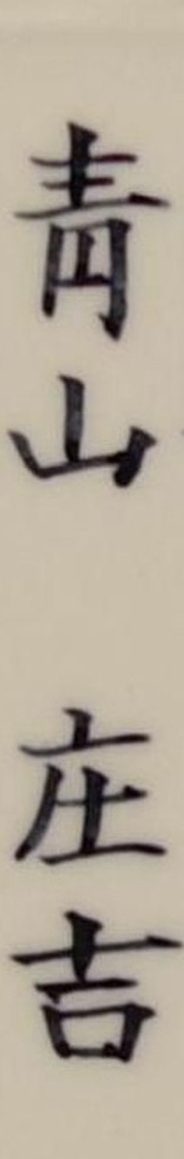青山庄吉
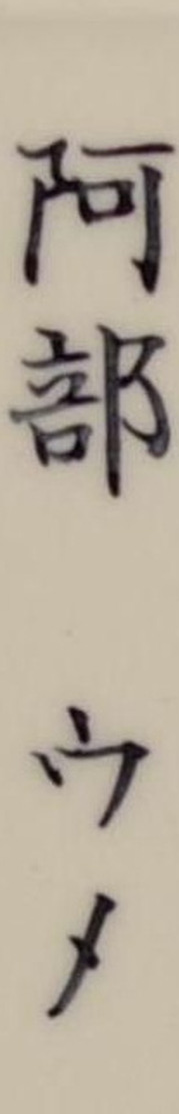阿部ウメ
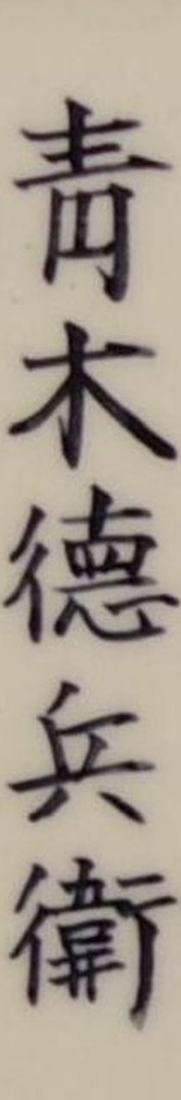青木徳兵衛
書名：M~S
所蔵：高野山金剛峯寺
